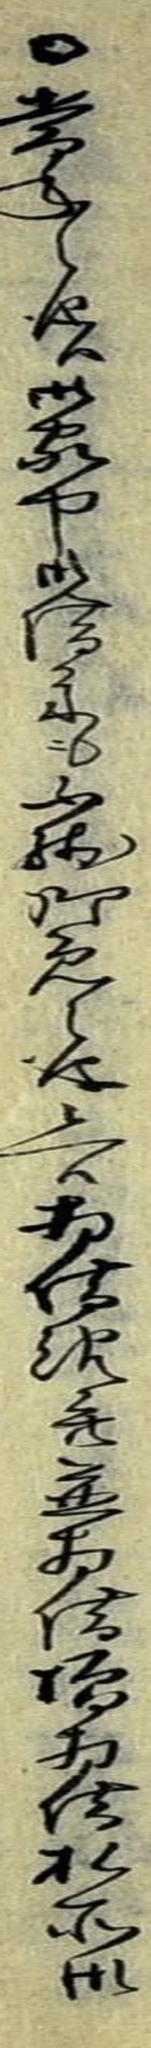〇当年之儀は御家中御借米も不残御免之儀候へは拝借銀并並拝借増拝借札所御
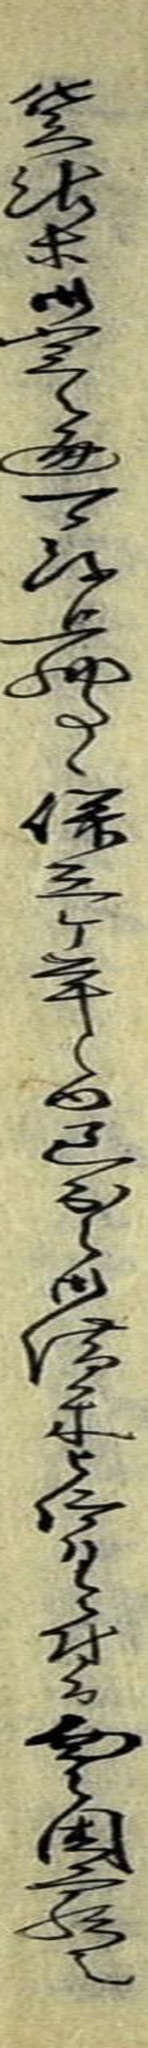貸銀等御定之通可致上納事候併三ヶ年之内過分之御借米被仰付候に付而面々困窮之
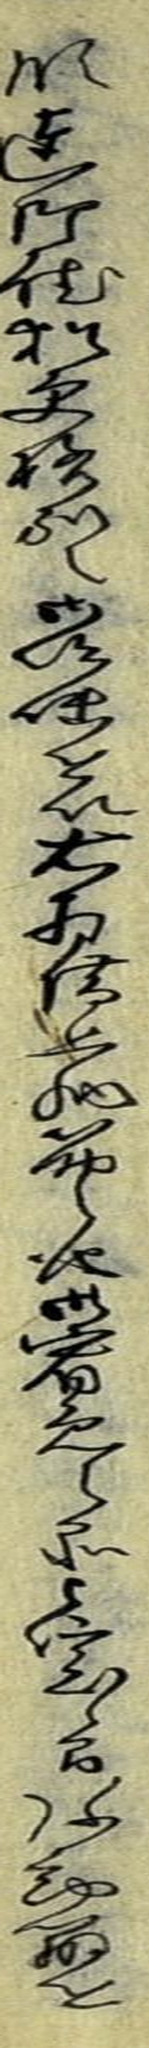段達御聴猶更格別之御吟味を以右拝借上納筋之儀御宥免之品被仰出候間弥勘弁を
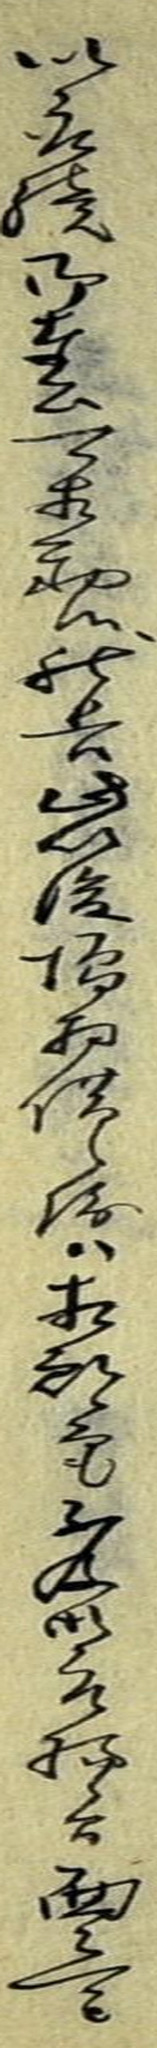以取続御奉公可相勤候然上は此以後増拝借之儀は相願候而も不及御取揚候間面々可被
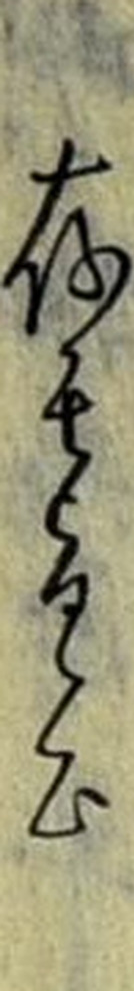存其旨以上
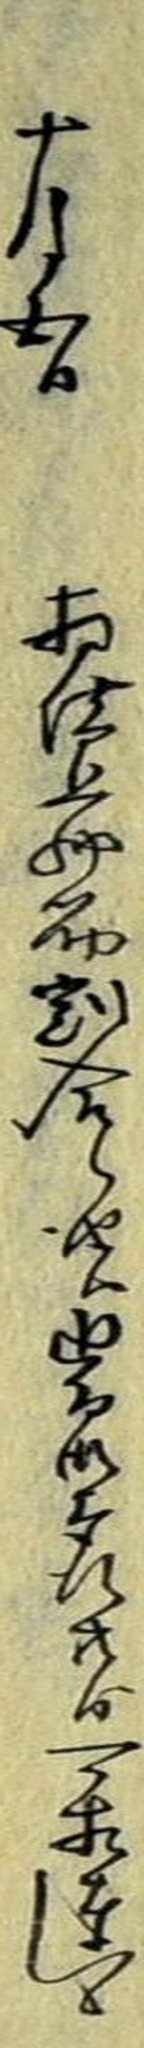十月五日拝借上納筋割合之儀は追而御奉行共ゟ可相達候

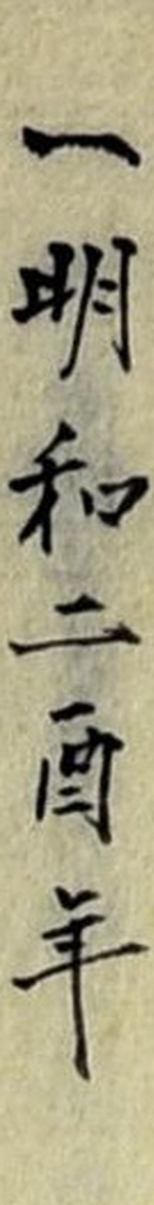一明和二酉年
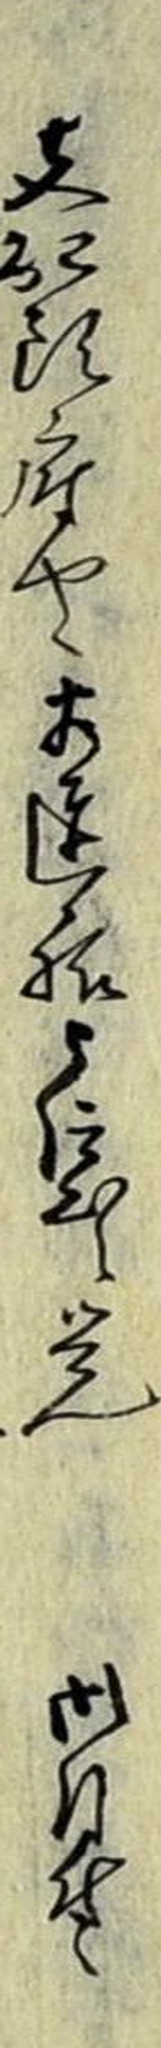支配頭府中へ相達候様被仰出候覚御目付へ
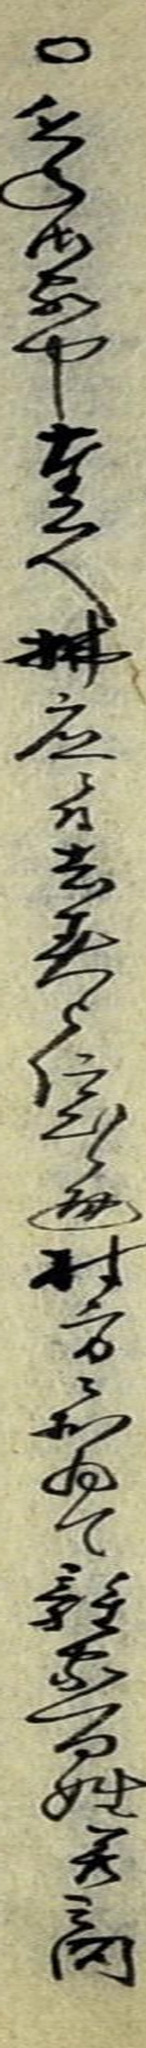〇近年御家中奉公人払底に付去春被仰出候通村方におゐて雑家百姓并商
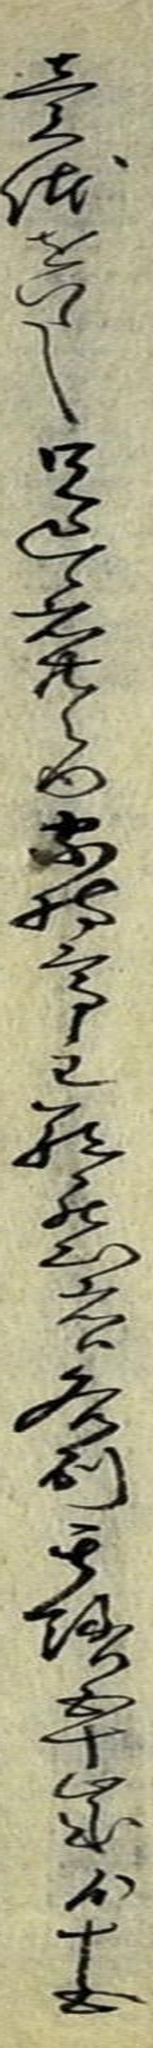売体をいたし口過候者共之内家持高主難罷出者は各別其余は五十歳ゟ十五
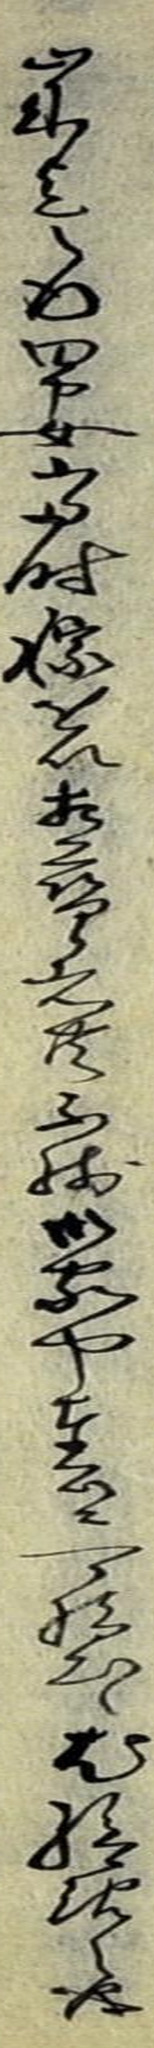歳迄之内男女当時稼を以相暮候者共不残御家中奉公に可指出候尤給銀之儀
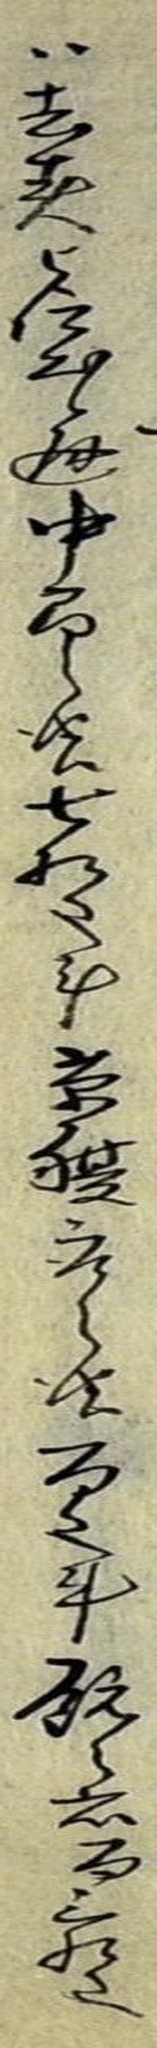は去春被仰出候通中間之儀は七拾匁斗草履取之儀は百匁斗厩之者百三拾匁
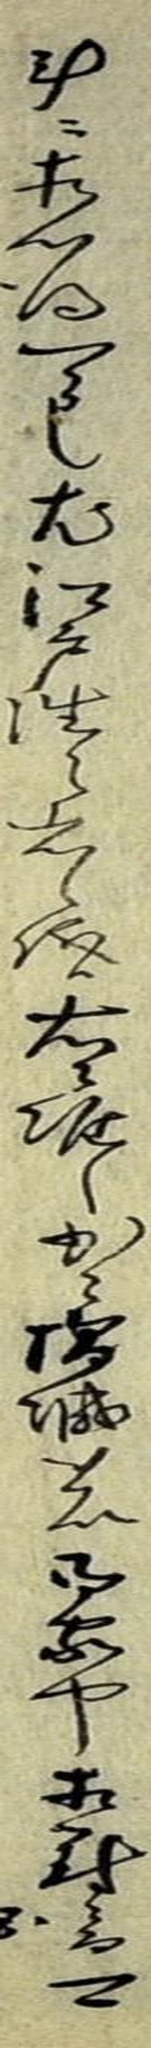斗に相心得可申候尤江戸往之者之儀は右に准し少々増減を以御家中相対に而可
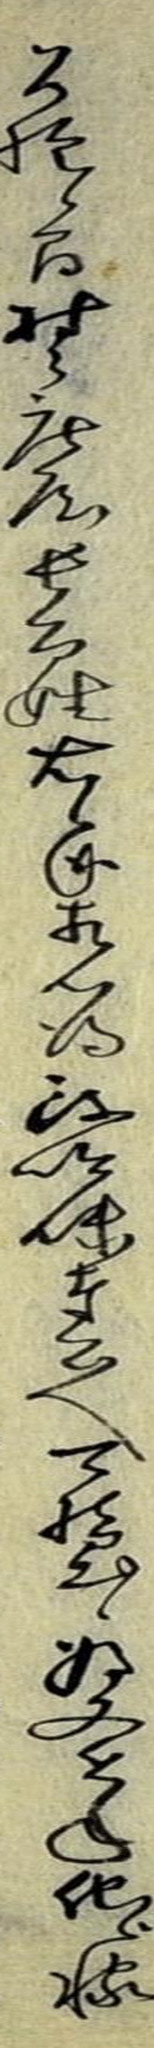召抱候間村々庄屋長百姓右之趣相心得致吟味奉公人可指出候将又近年他国稼
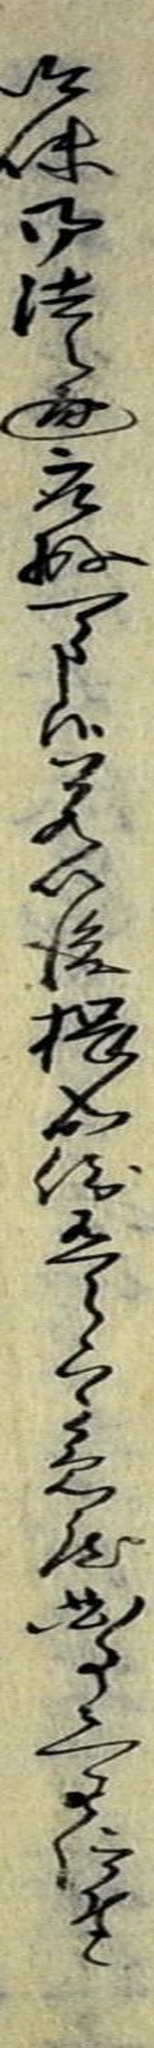吟味御法之通取扱可申候若以後猥成儀有之候はゝ急度曲事に可被仰付候
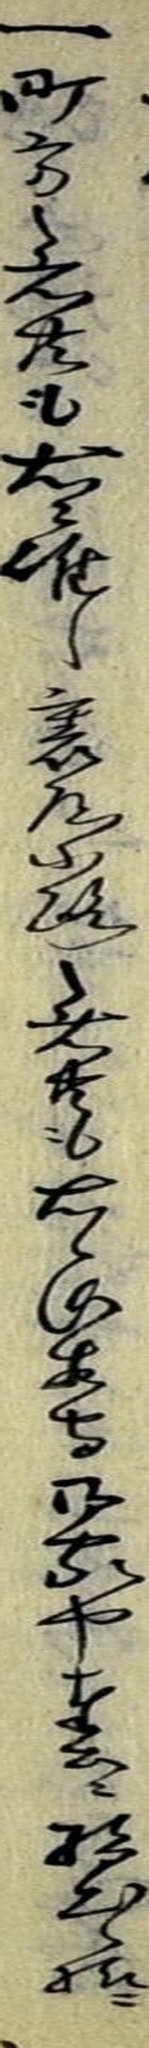一町方之者共も右に准し裏屋小路之者共も右之趣相守御家中奉公に指出候様に
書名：命令之部 二
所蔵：福井県文書館 Fukui Prefectural Archives
